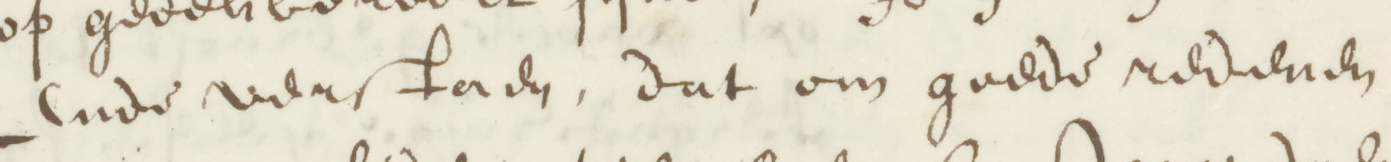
ende verstaen, dat om goede redenen
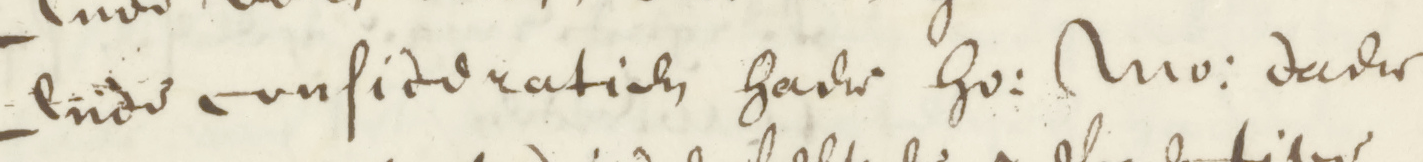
Ende consideratien haer ho:Mo: daer
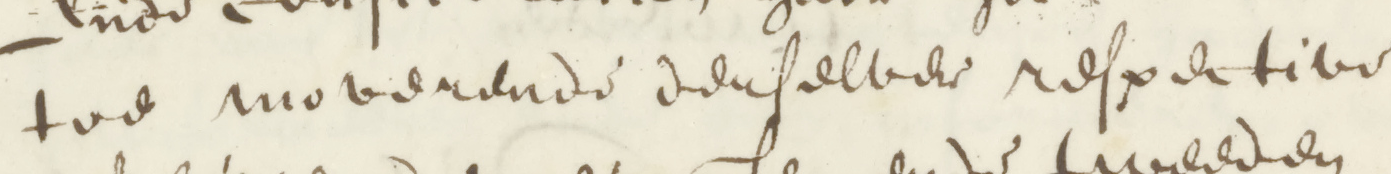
toe moverende derselver respective
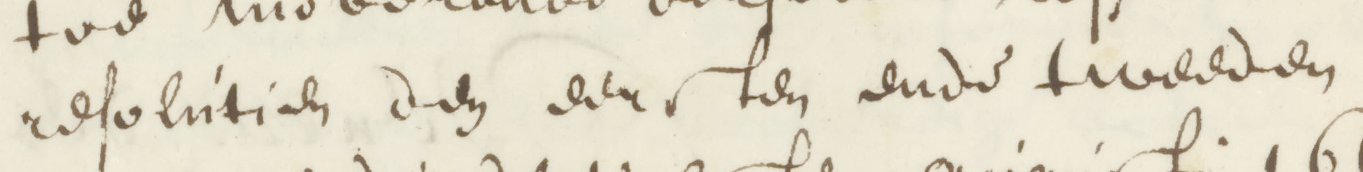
resolutien den eersten ende tweeden
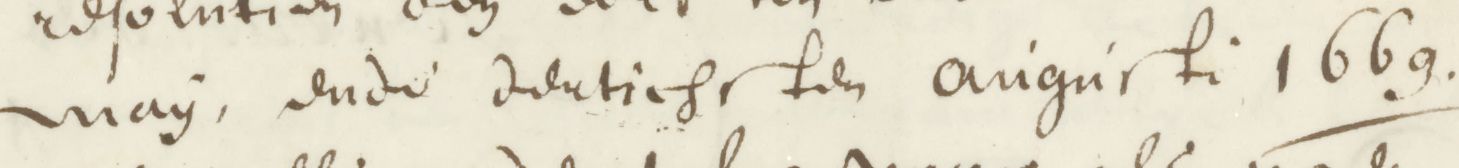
maij, ende dertichsten Augusti 1669.
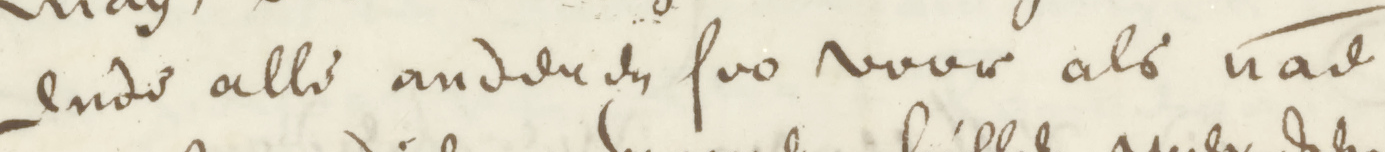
ende alle anderen soo voor als nae
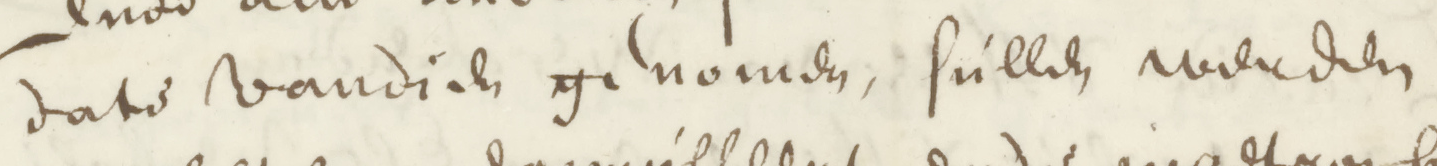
date vandien genomen, sullen werden
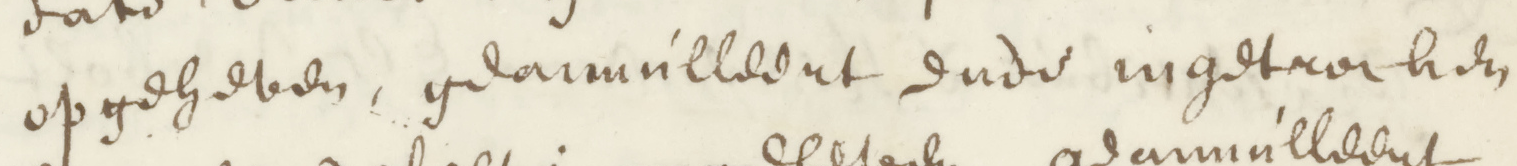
opgeheven, geannulleert ende ingetrocken
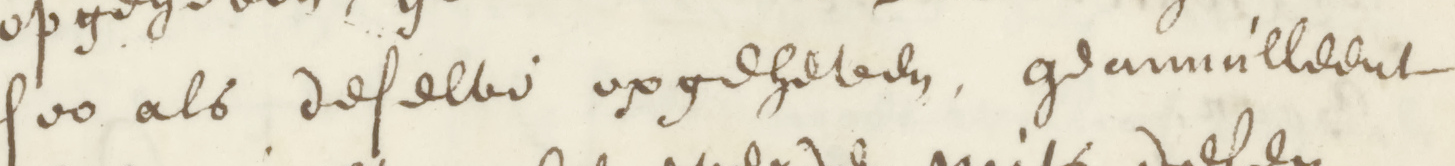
soo als deselve opgeheven, geannulleert
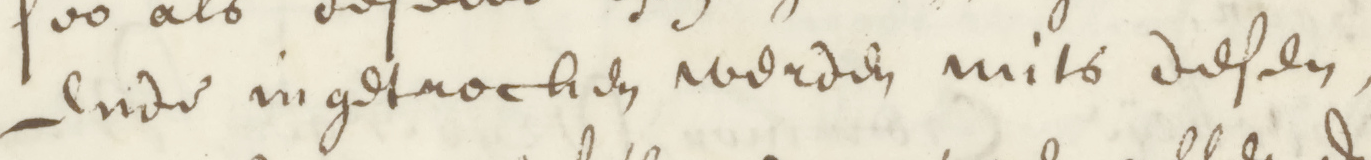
ende ingetrocken werden mits desen,
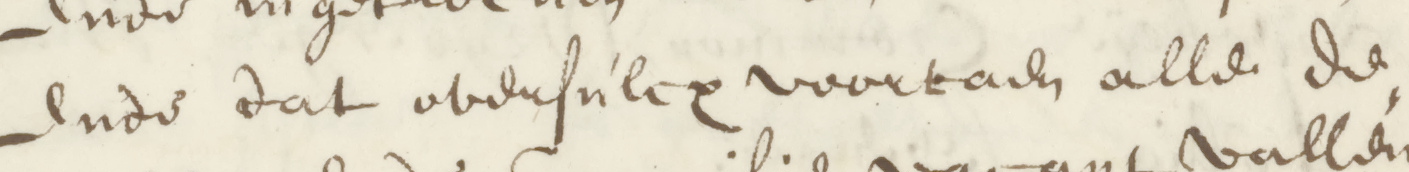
ende dat oversulcx voortaen alle de„
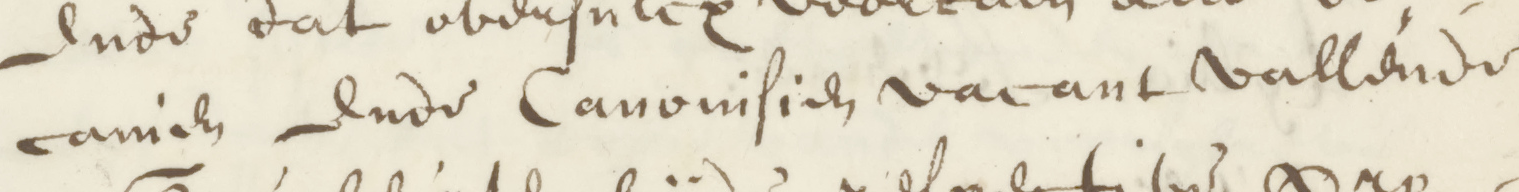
canien ende Canonisien vacant vallende
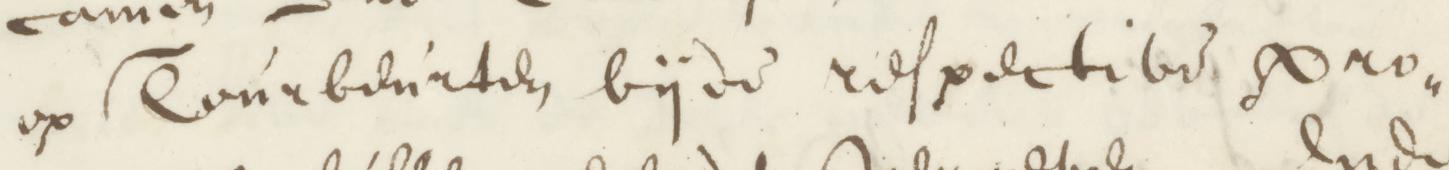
op Tourbeurten bijde respective Pro„
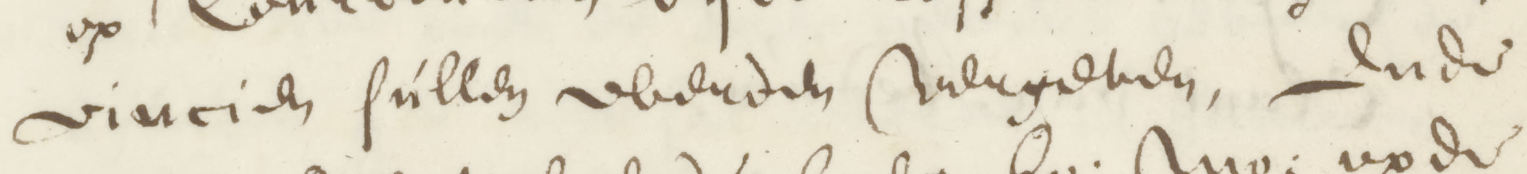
vincien sullen werden vergeven, Ende
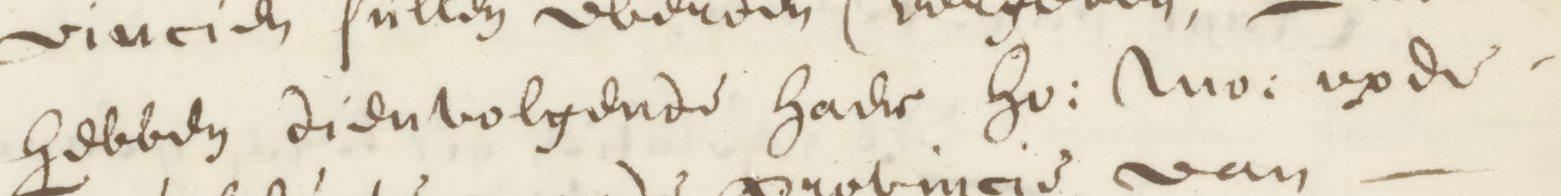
hebben dienvolgende haer ho:Mo: opde
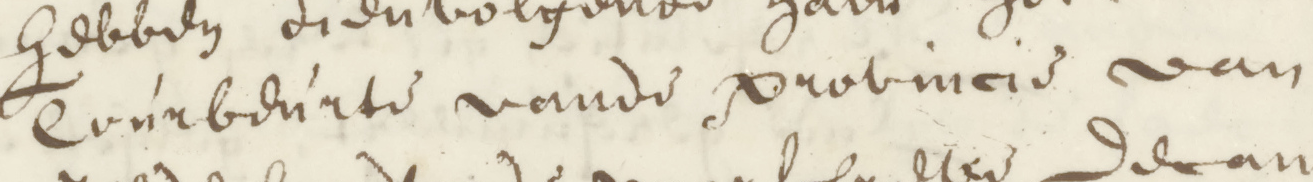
Tourbeurte vande provincie van
